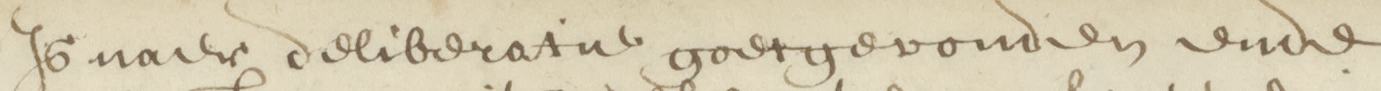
Is naer deliberatie goetgevonden ende
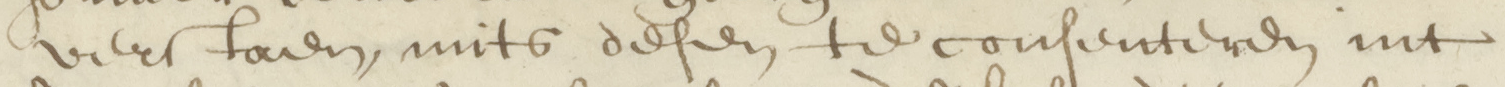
verstaen, mits desen te consenteren int
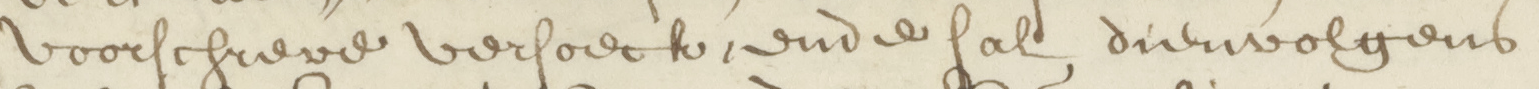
voorschreve versoeck, ende sal dienvolgens
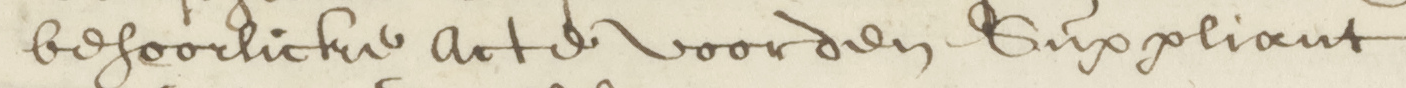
behoorlicke Acte voorden Suppliant
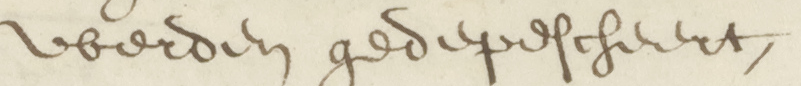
werden gedepescheert.
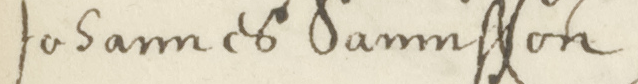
Johannes Sannisson
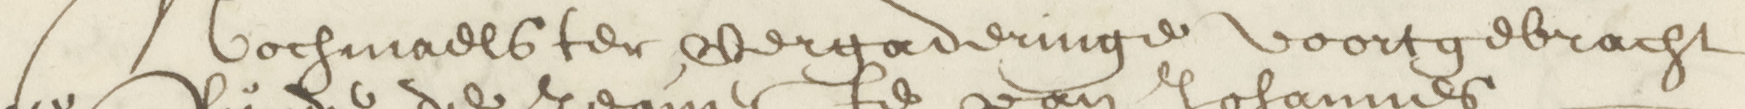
Nochmaels ter Vergaderinge voortgebracht
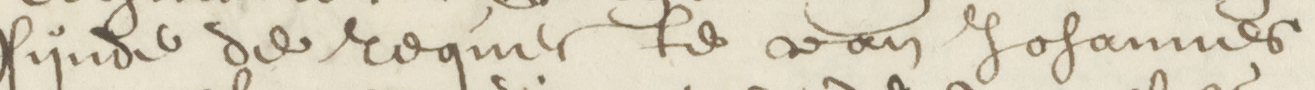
sijnde de requeste van Johannes
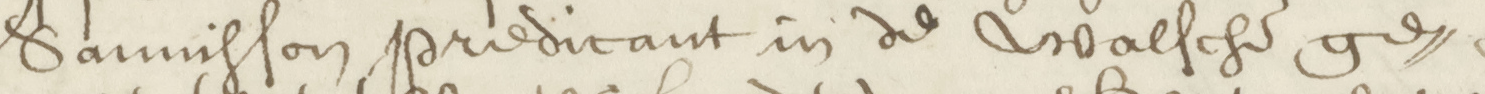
Sannisson predicant in de Walsche ge„
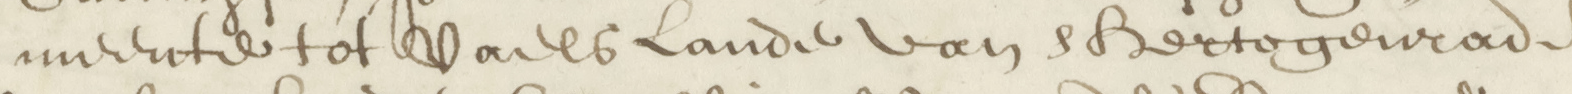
meente tot Vaels Lande van sHertogenrade
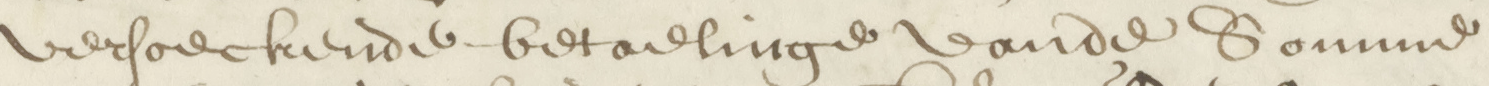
versoeckende betaelinge vande Somme
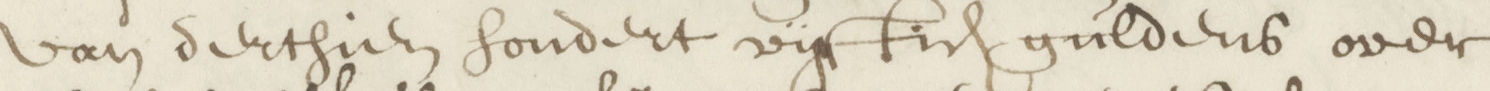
van derthien hondert vijftich guldens over
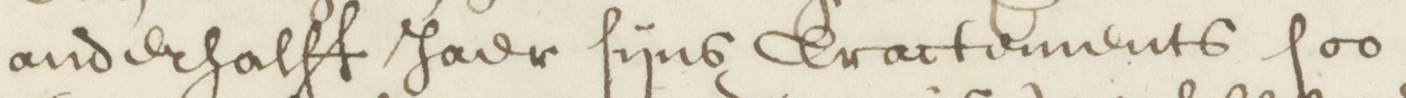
anderhalff Jaer sijns Tractements soo
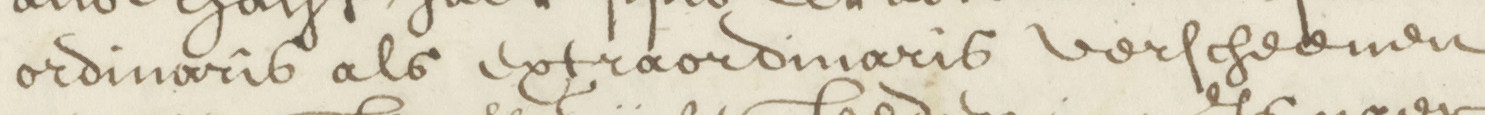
ordinaris als extraordinaris verscheenen
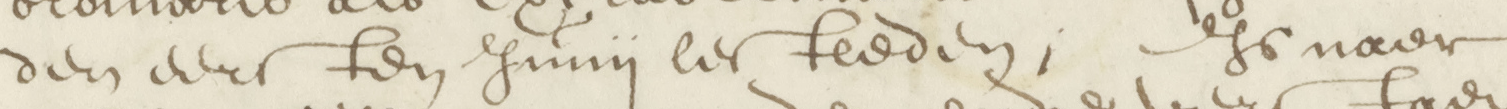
den eersten Junij lestleden, Is naer
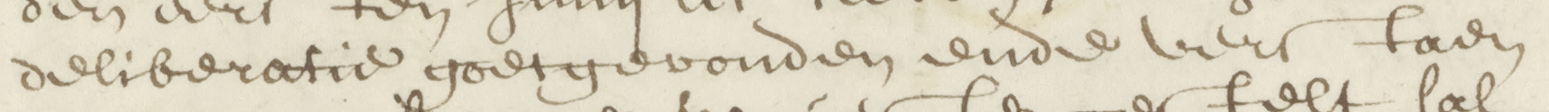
deliberatie goetgevonden ende verstaen
